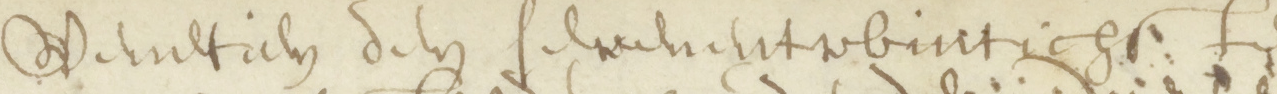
Venetien den sevenentwintichste
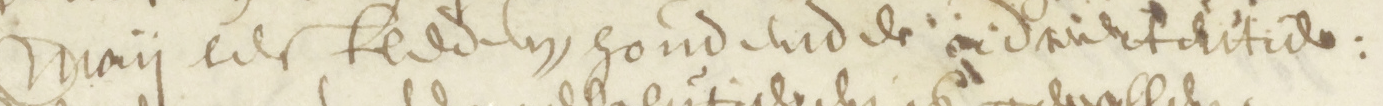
Maij lestleden, houdende advertentie:
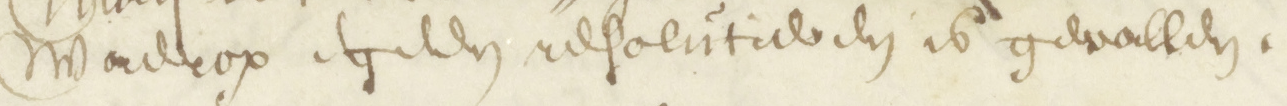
Waerop egeen resolutie en is gevallen.
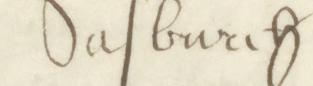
Sasburch
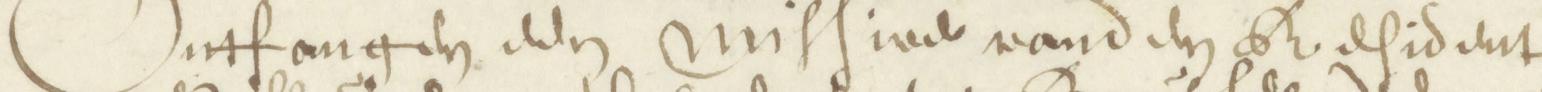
Ontfangen een Missive vanden Resident
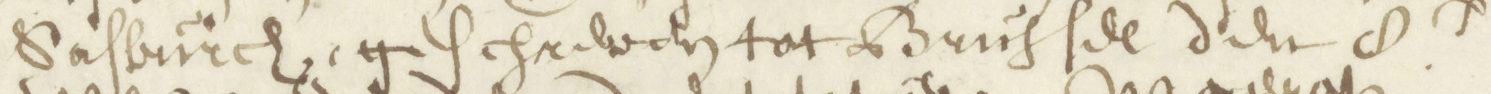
Sasburch, geschreven tot Brussel den 8e.
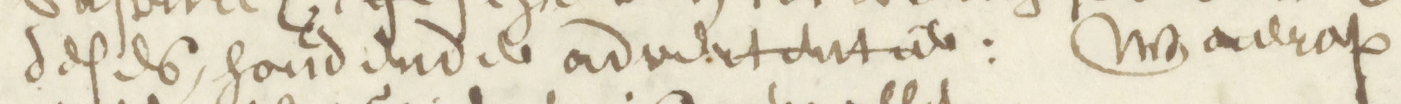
deses, houdende advertentie: Waerop
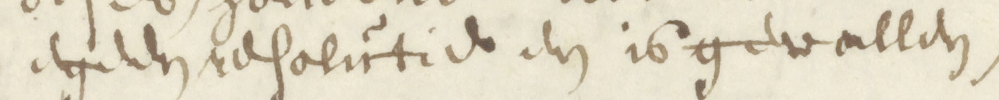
egeen resolutie en is gevallen.
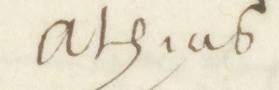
Athias
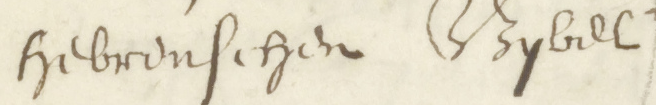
hebreuschen Bybel
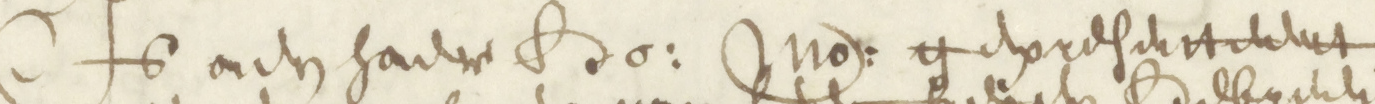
Is aen haer Ho:Mo: gepresenteert
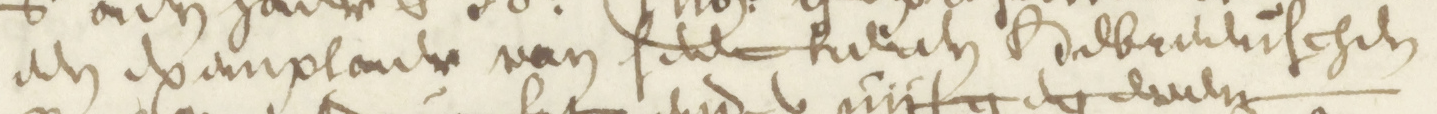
een exemplaer van seeckeren Hebreeuschen
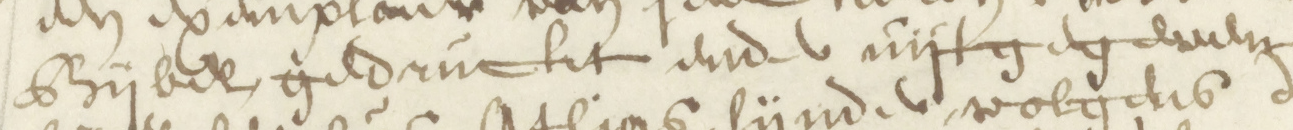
Bijbel, gedruckt ende uijtgegeven
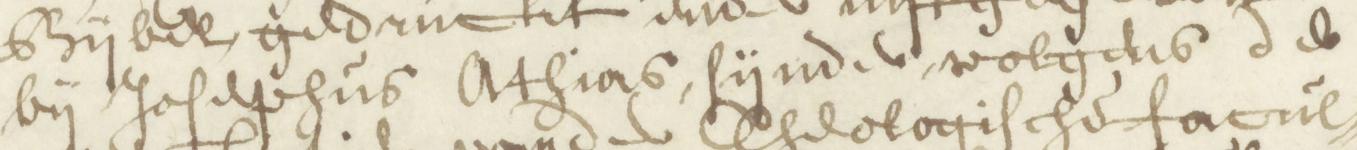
bij Josephus Athias, sijnde, volgens de
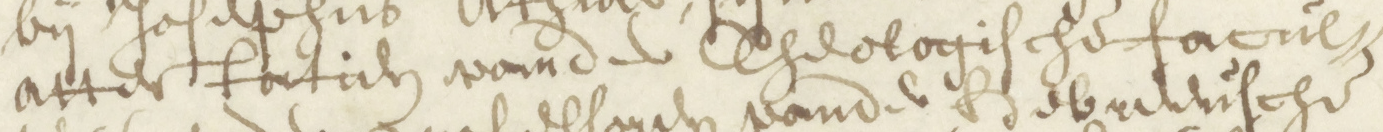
attestatien vande Theologische facul„
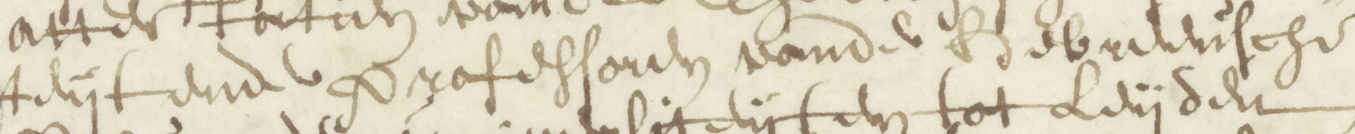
teijt ende Professoren vande Hebreeusche
